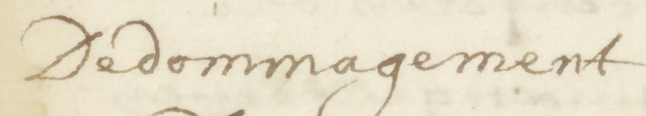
Dedommagement
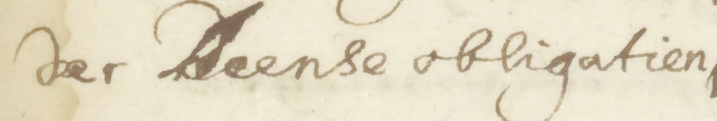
der Deense obligatien
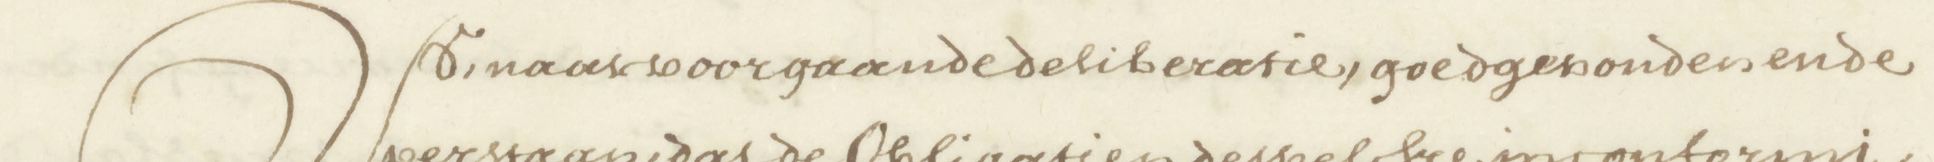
Is naar voorgaande deliberatie, goedgevonden ende
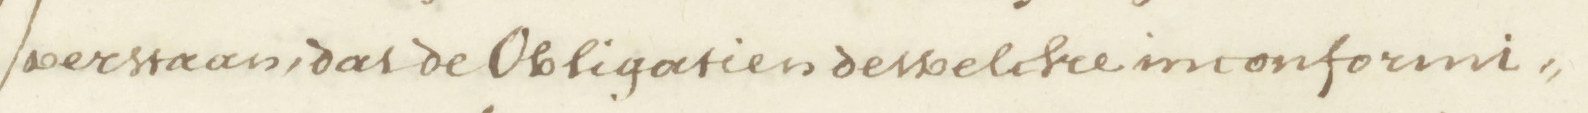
verstaan, dat de Obligatien dewelcke in conformi„
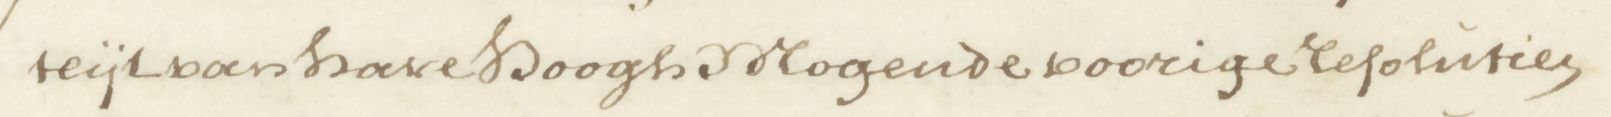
teijt van hare Hoogh Mogende voorige resolutien
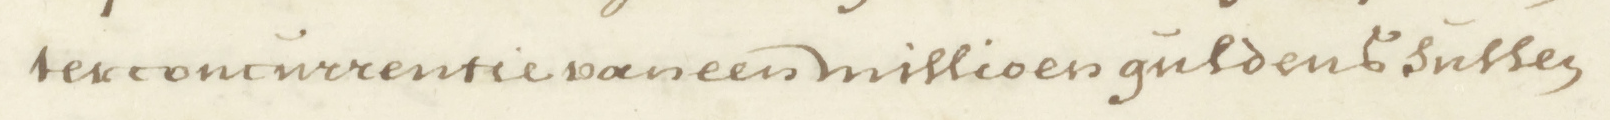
ter concurrentie van een millioen guldens sullen
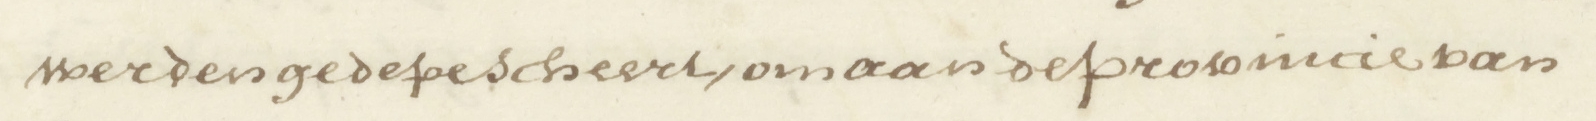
werden gedepescheert, om aan de provincie van
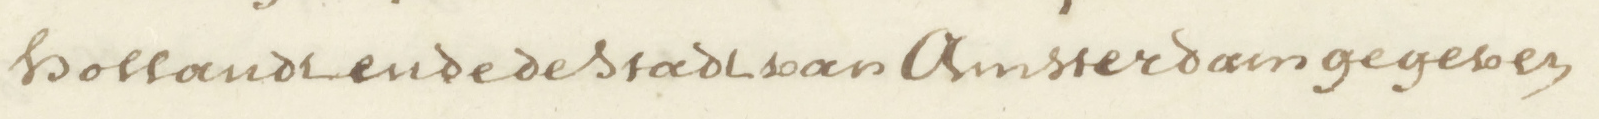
Hollandt ende de stadt van Amsterdam gegeven
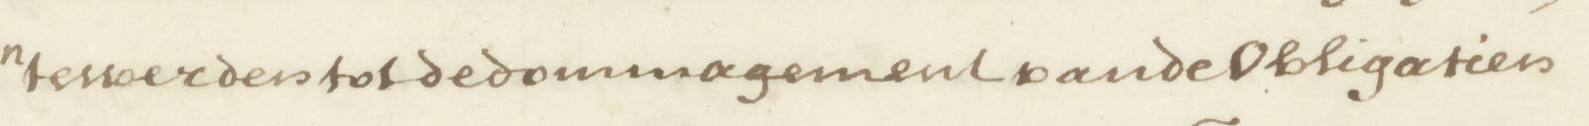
te werden tot dedommagement vande obligatien
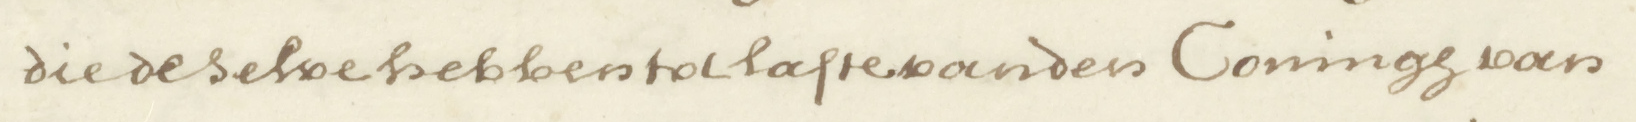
die deselve hebben tot laste vanden Coningh van
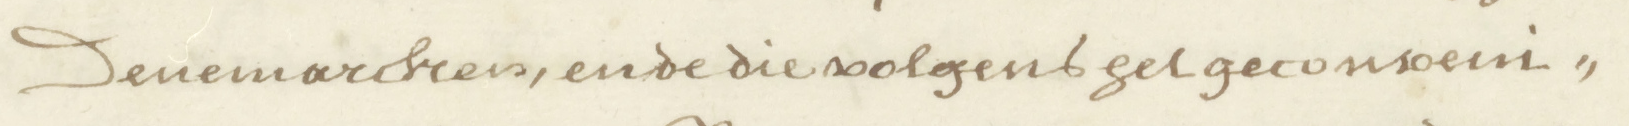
Denemarcken, ende die volgens het geconveni„
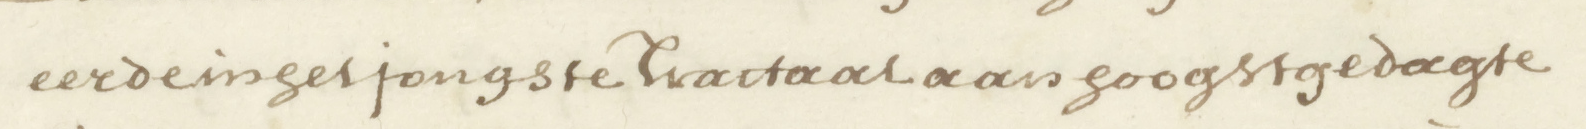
eerde in het jongste Tractaat aan hoogstgedagte
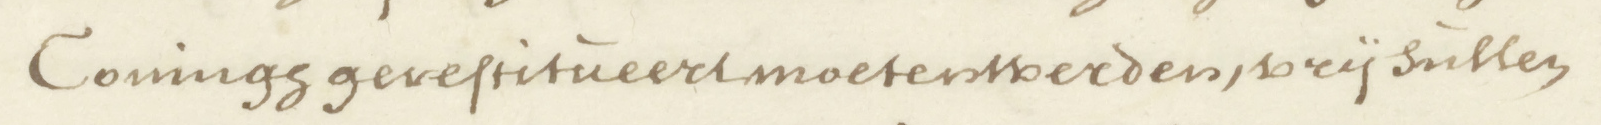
Coningh gerestitueert moeten werden, vrij sullen
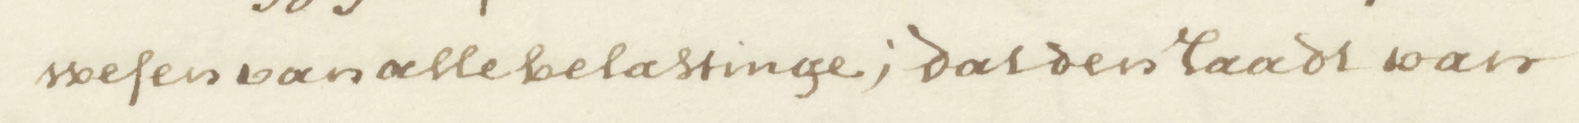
wesen van alle belastinge, dat den raadt van
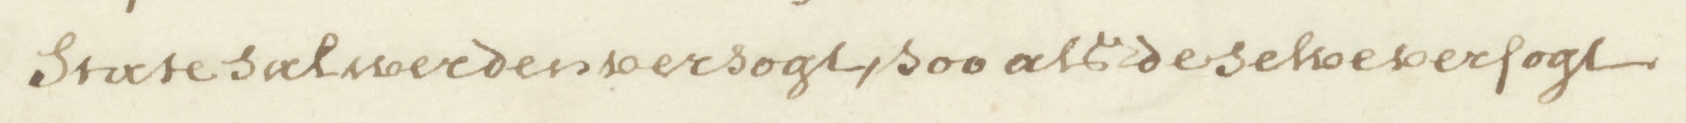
State sal werden versogt, soo als deselve versogt
